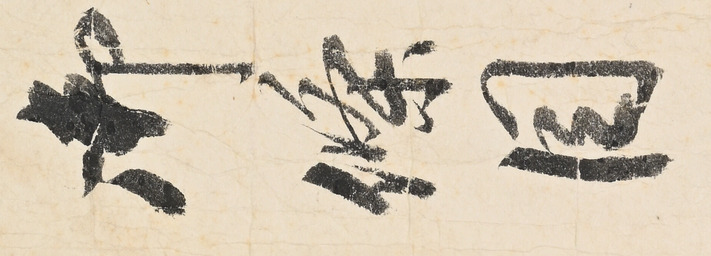御條目

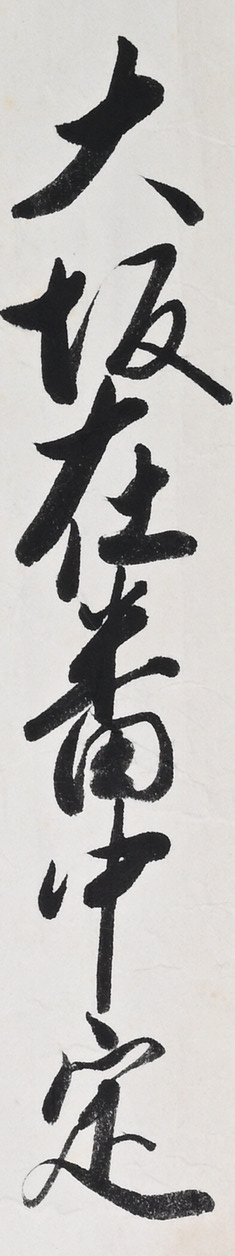大坂在番中定
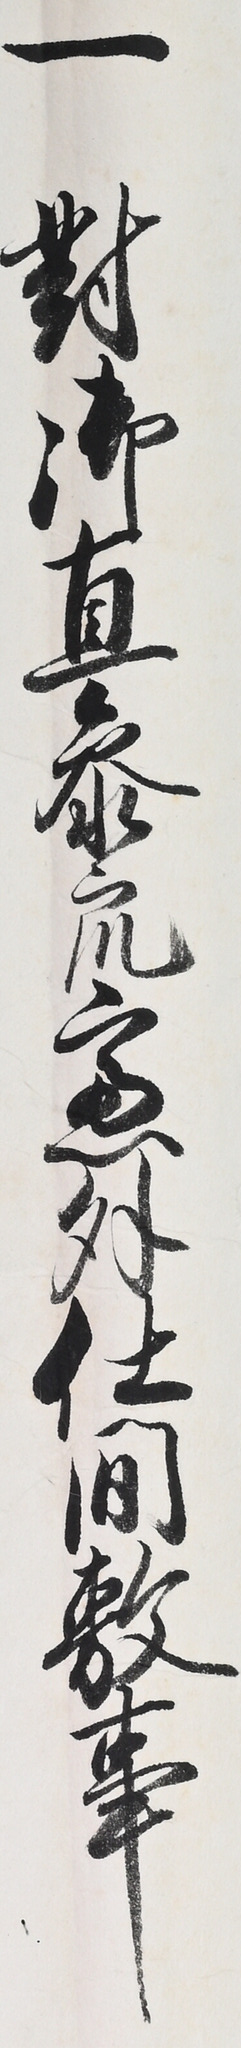一対御直参衆慮外仕間敷事
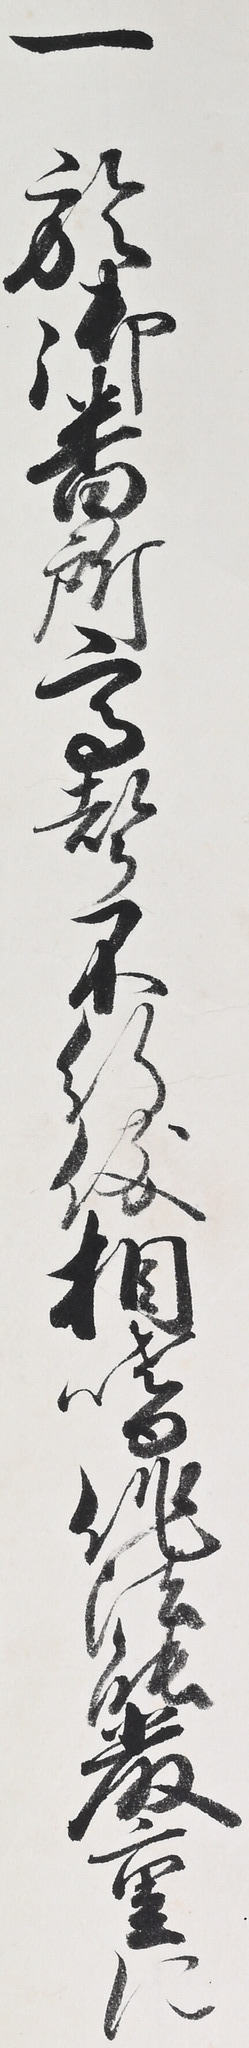一於御番所高声不行儀相嗜作法能厳重に
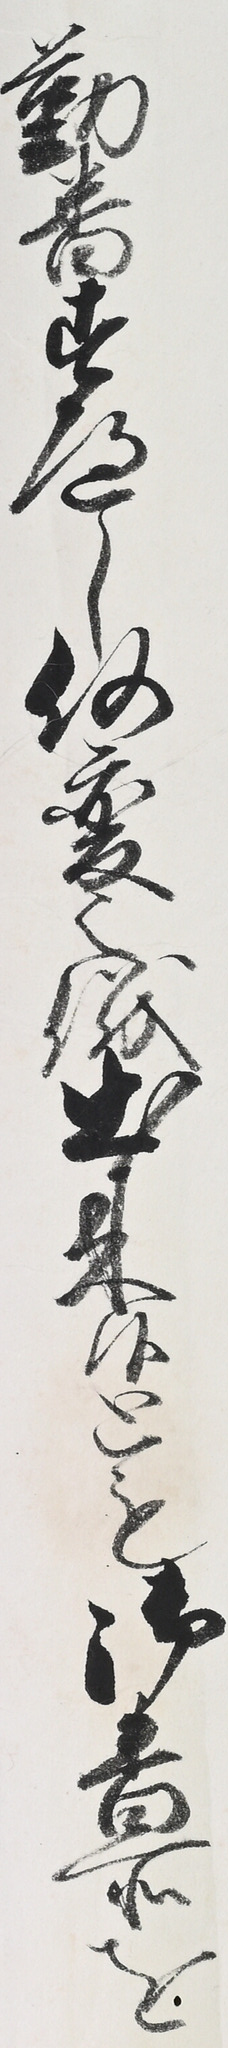勤番すへし何変之儀出来候とも御番所を
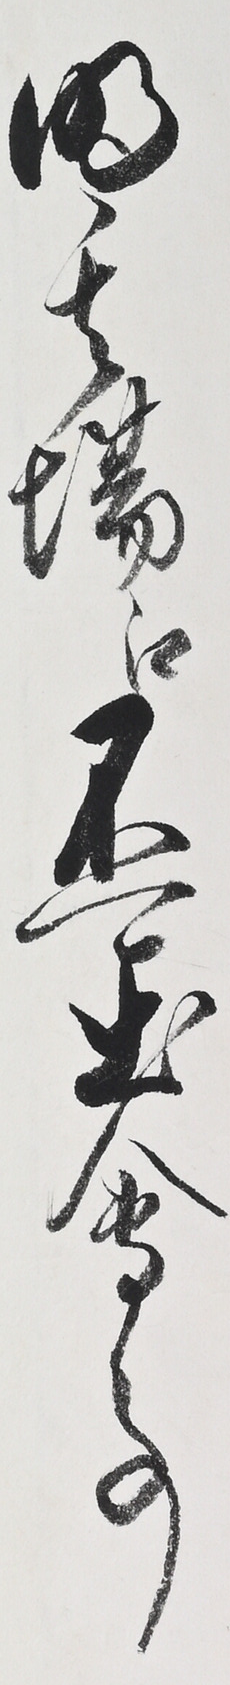明其場江不可出会事
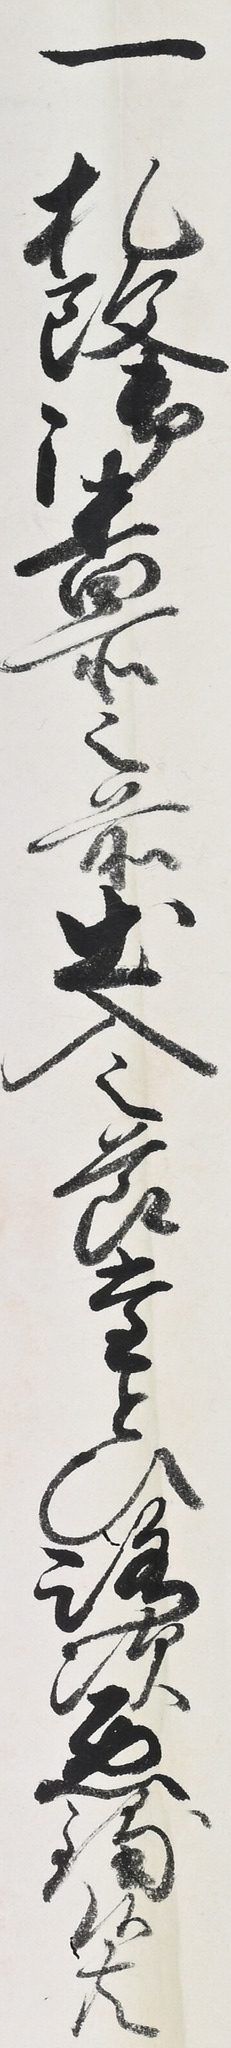一札改御番所之前出入之節たとひ路次悪鋪候共
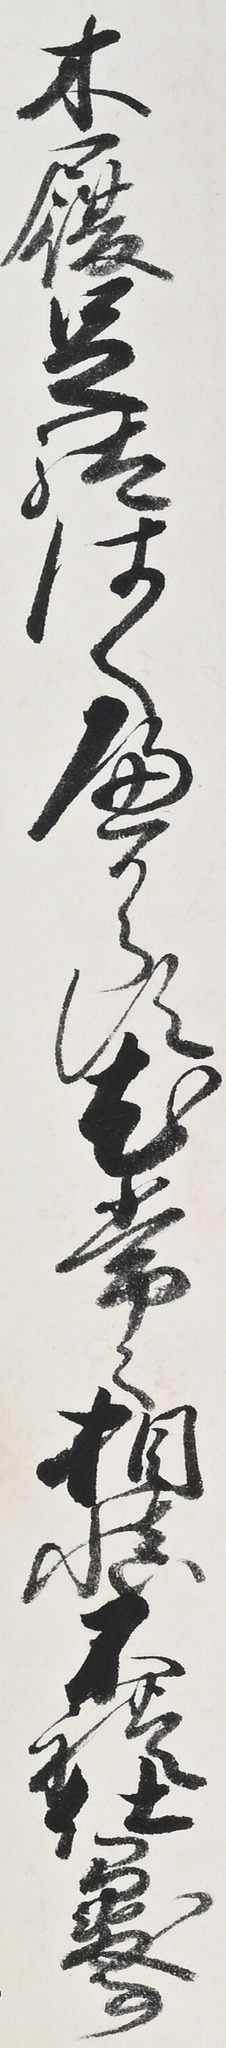木履足駄はくへからす尤常々相慎不礼仕間敷事
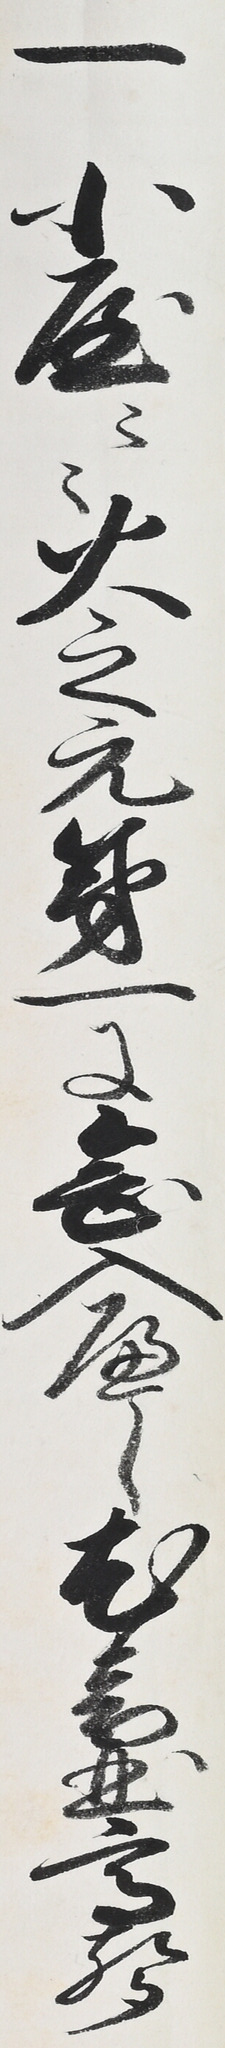一小屋々々火之元第一に念入へし尤音曲高声
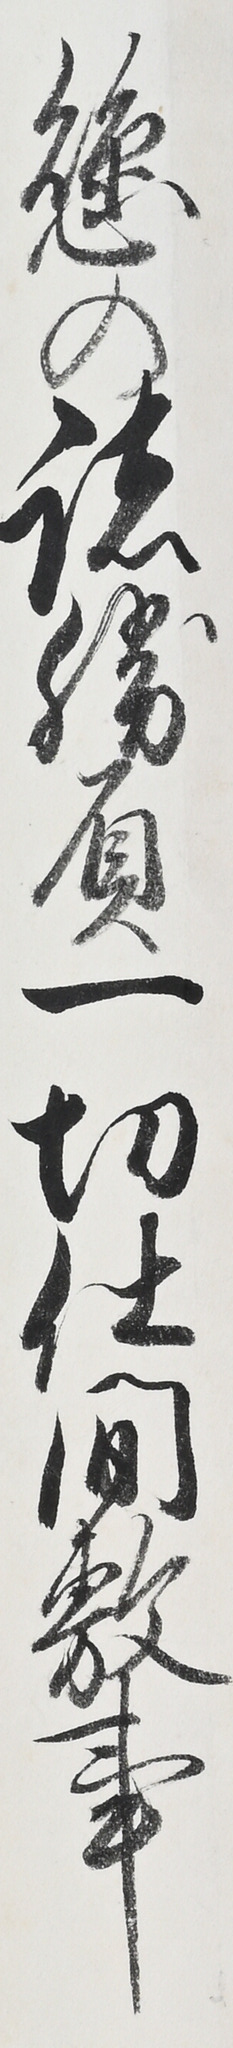懸の諸勝負一切仕間敷事
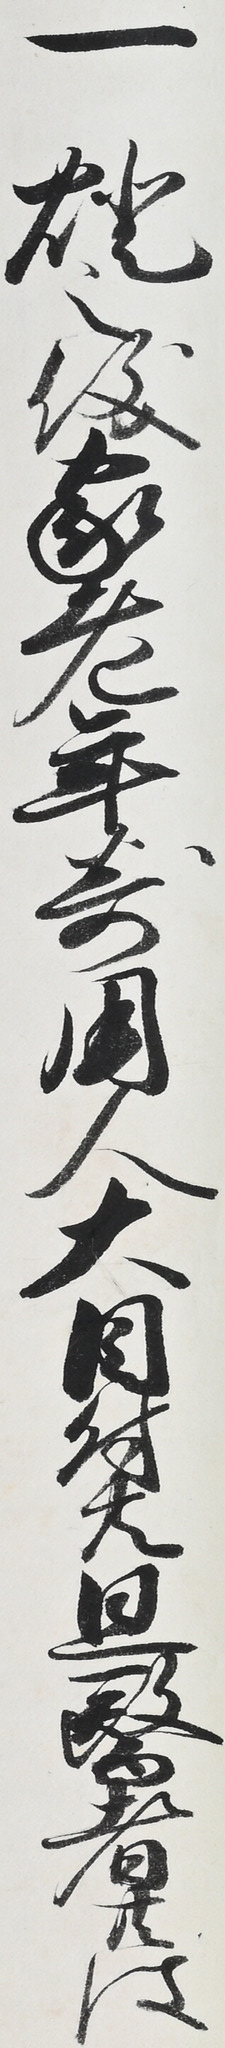一燈之儀家老年寄用人大目付共且医者共は
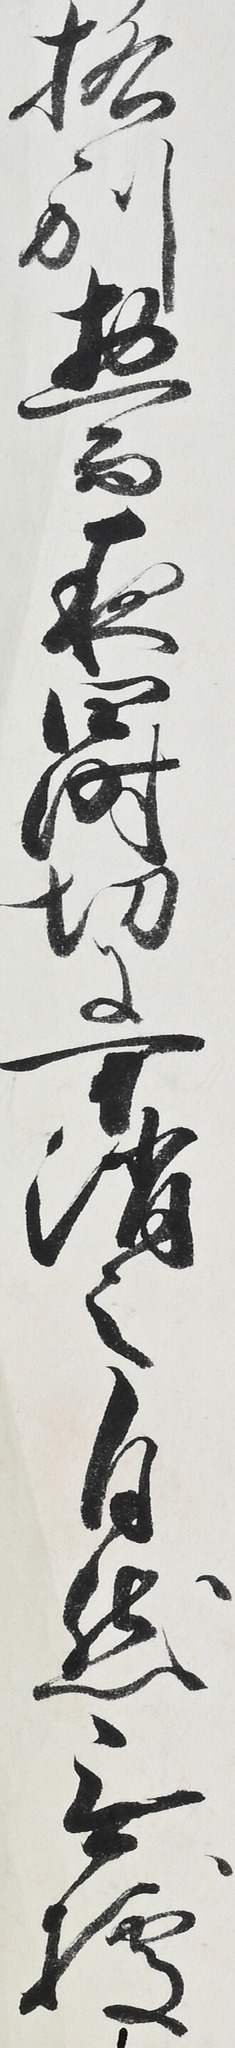格別惣而夜四時切に可消之自然無拠

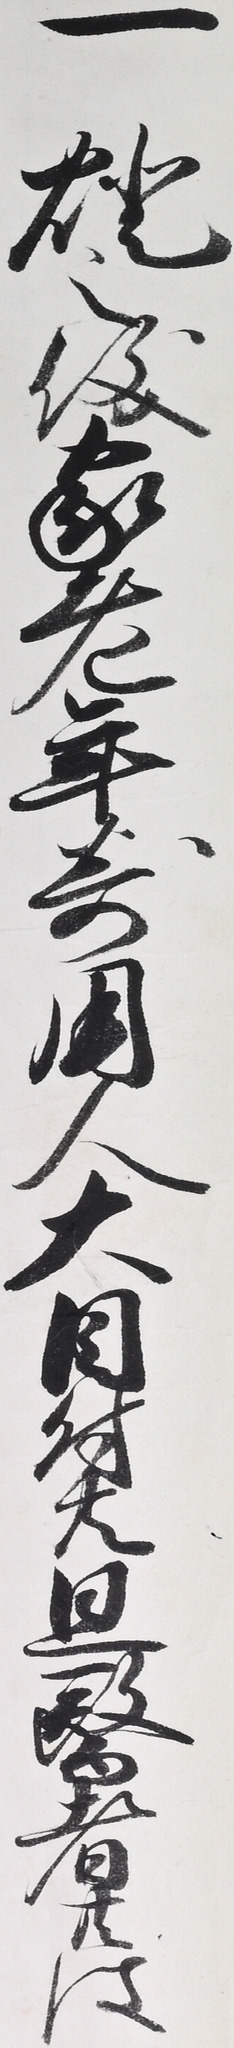一燈之儀家老年寄用人大目付共且医者共は
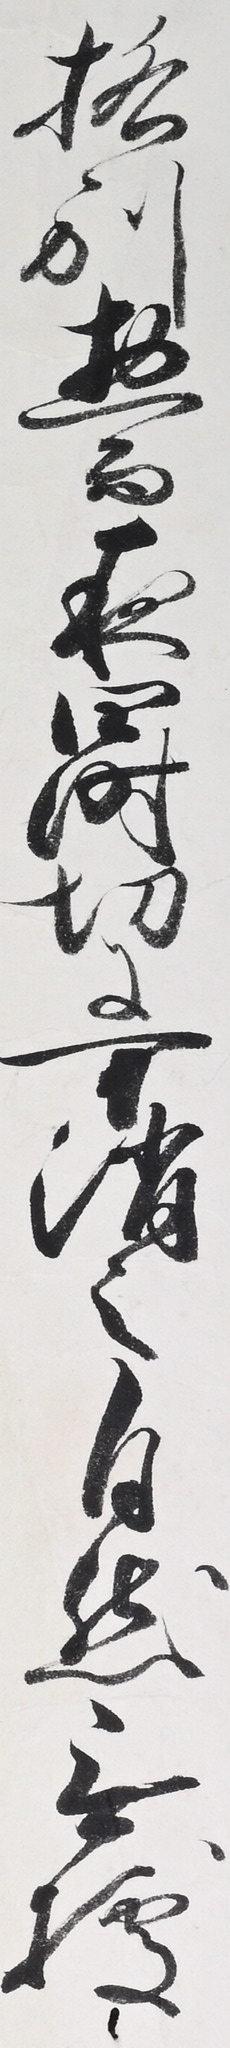格別惣而夜四時切に可消之自然無拠ら
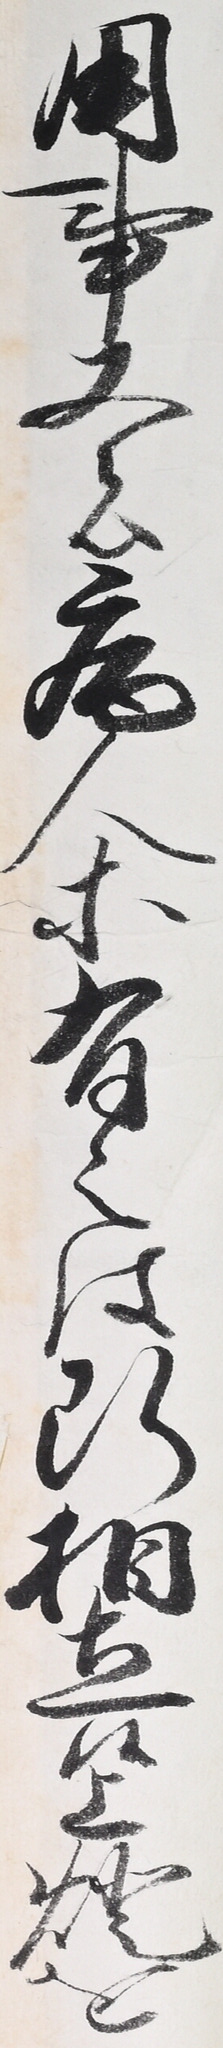用事又者病人等有之は断相立候上燈を
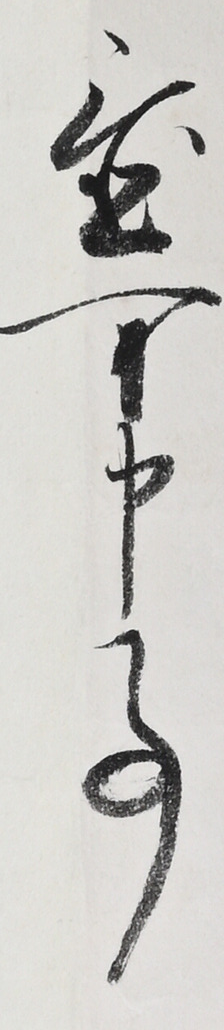置可申事
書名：御条目
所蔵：伊那市立高遠町図書館・合同会社AMANE
